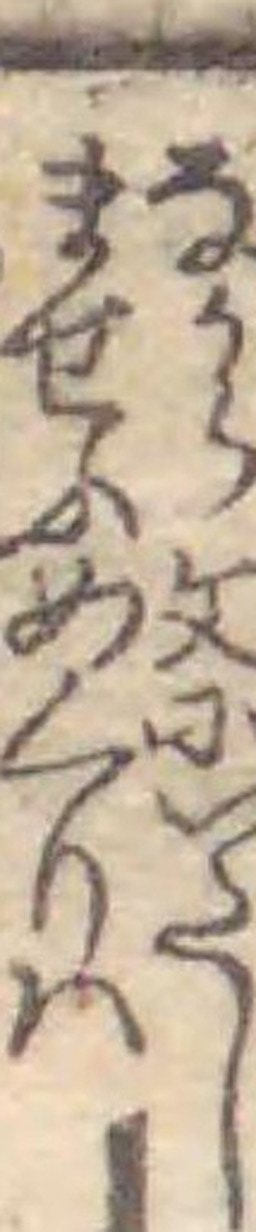ませふめくりは
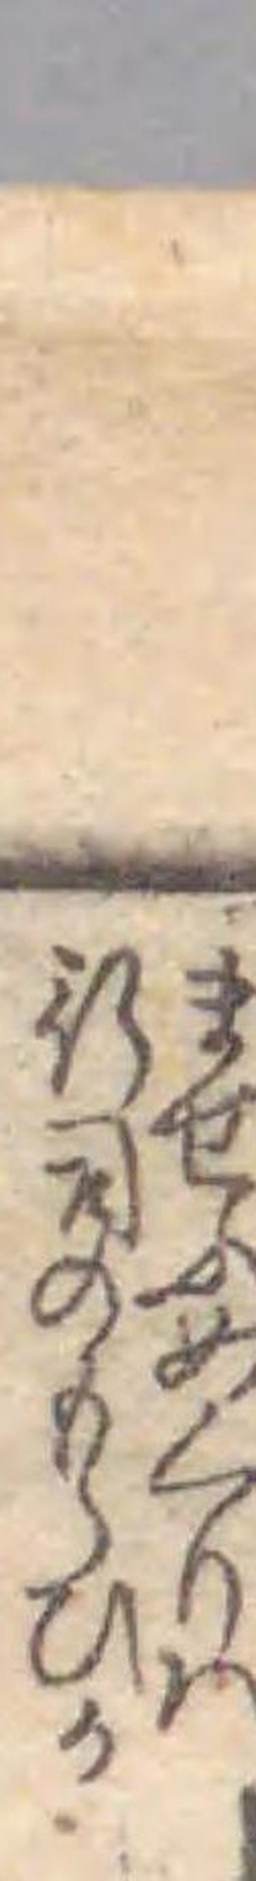行司のもらひか
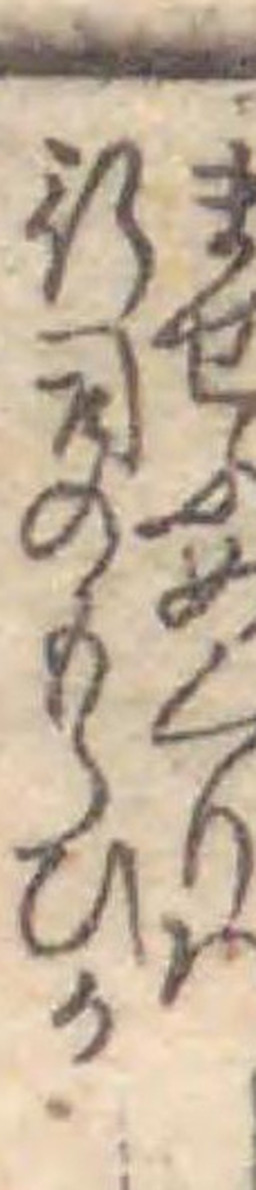行司のもらひか
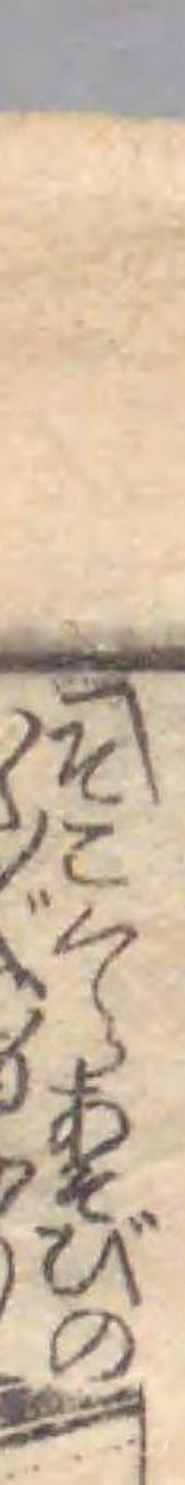〽そこくらあそびの
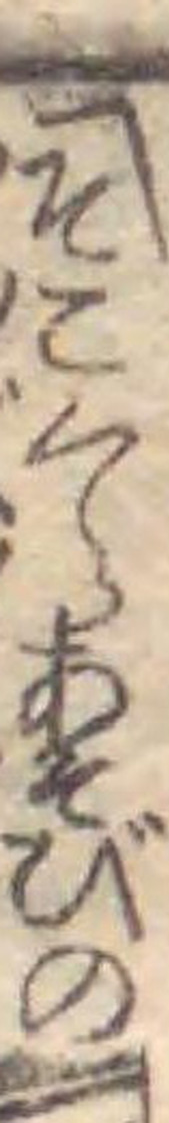〽そこくらあそびの
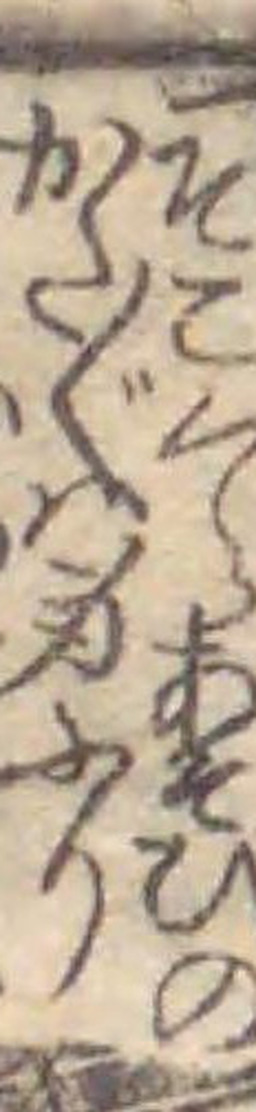かた〴〵は身ふり
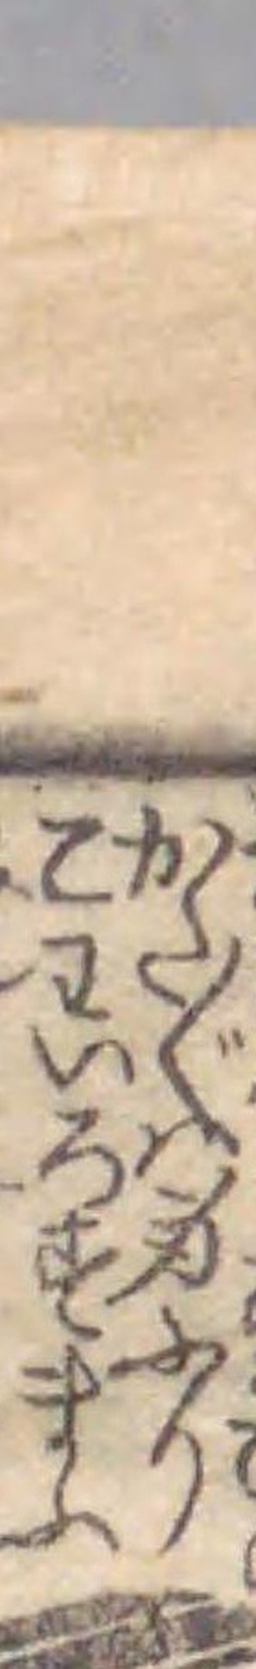こわいろすまふ
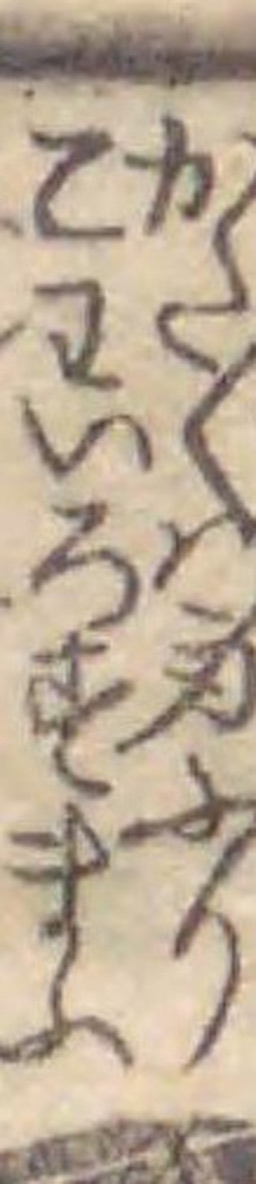こわいろすまふ
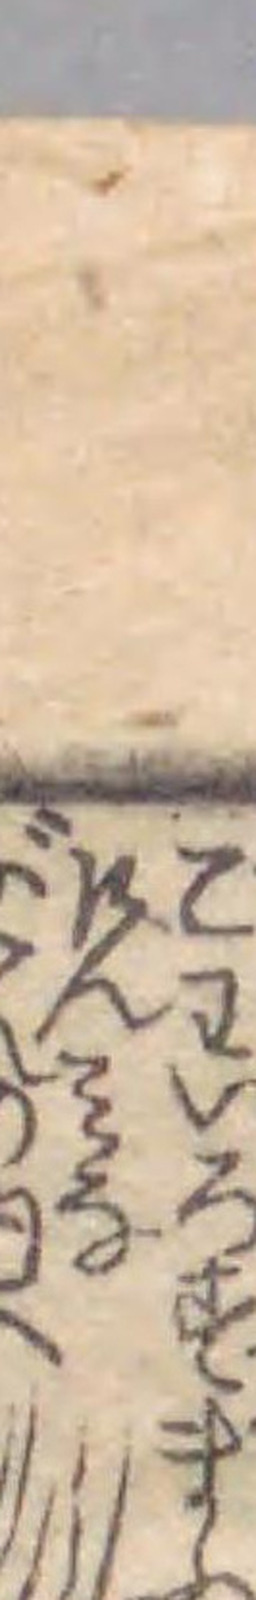けんみな
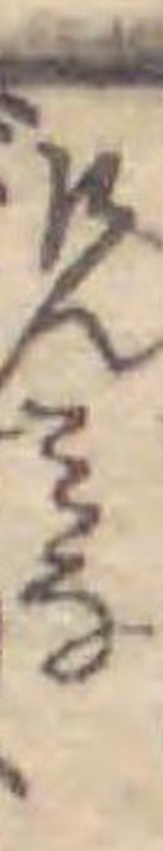けんみな
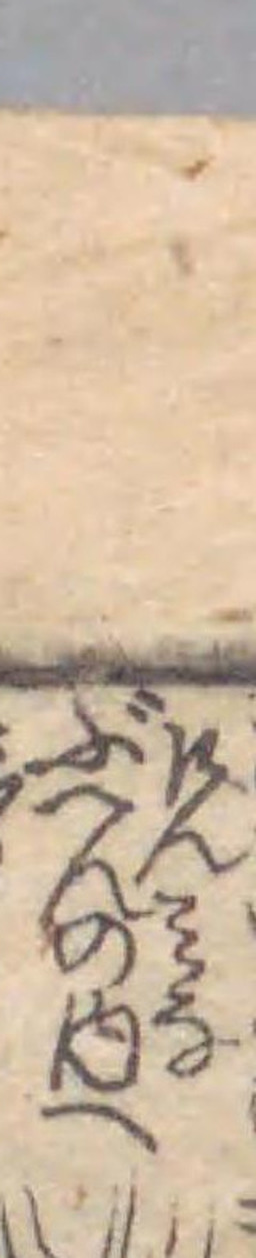ぶへんの内へ
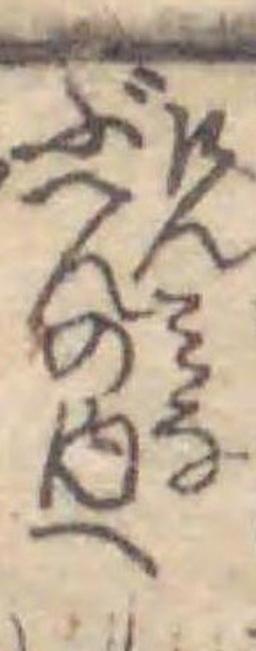ぶへんの内へ
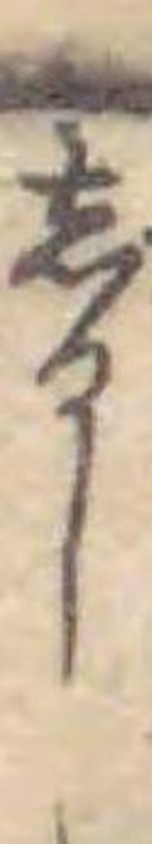しるし
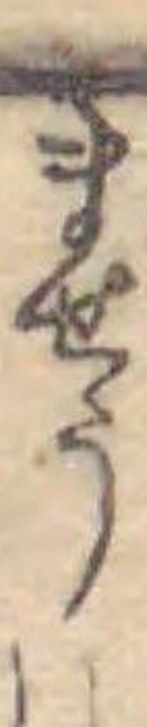ませう

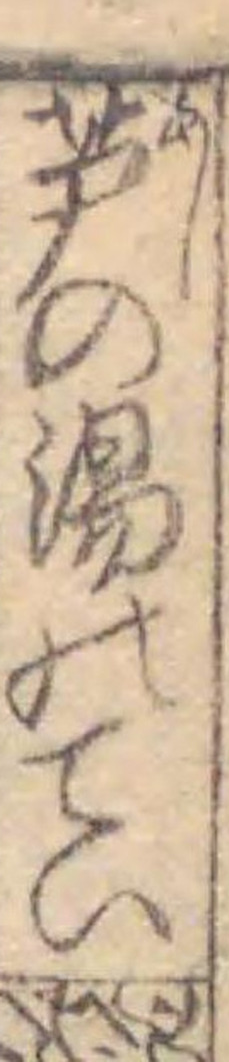芦の湯のてい
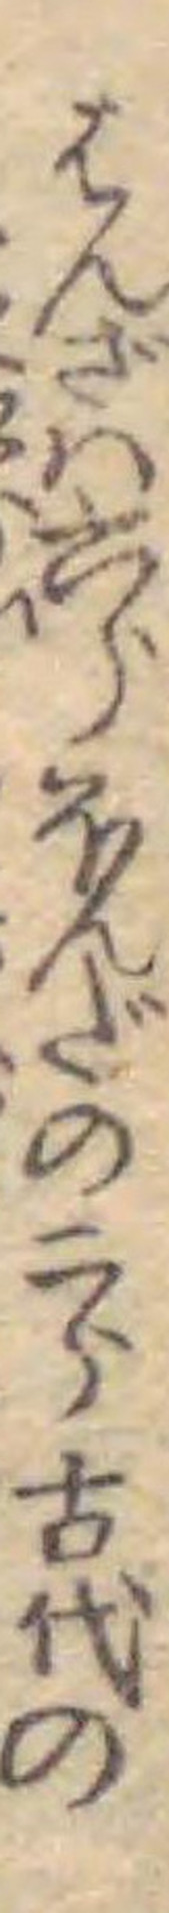はんざは六郎ほんだの二郎古代の
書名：文武二道万石通 : 3巻
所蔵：国立国会図書館 National Diet Library, JAPAN
